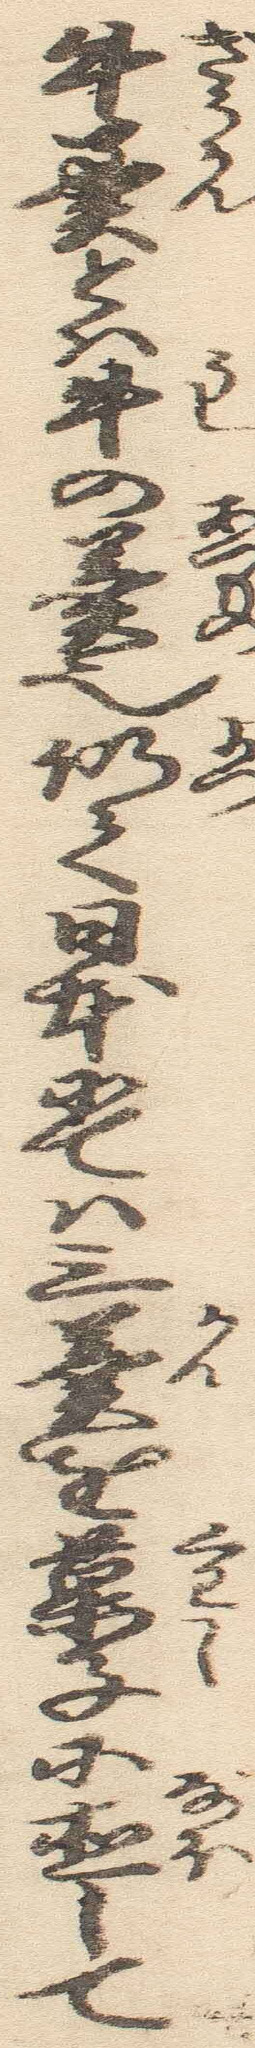牛羹とは牛の羹也仍て日本にては三羹を菓子に直して
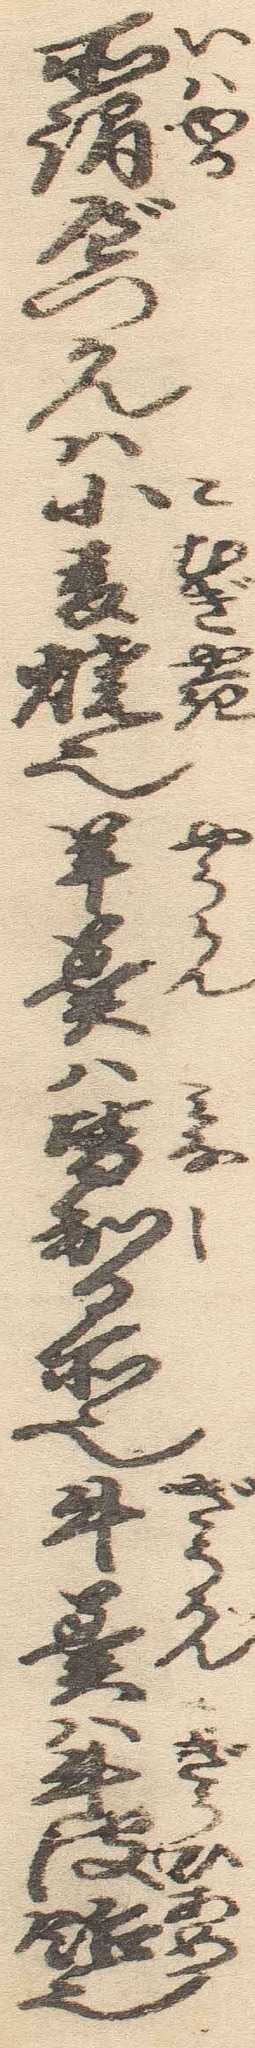所謂べつかんは小麦焼也羊羹は皆知る所也牛羹は牛皮飴也
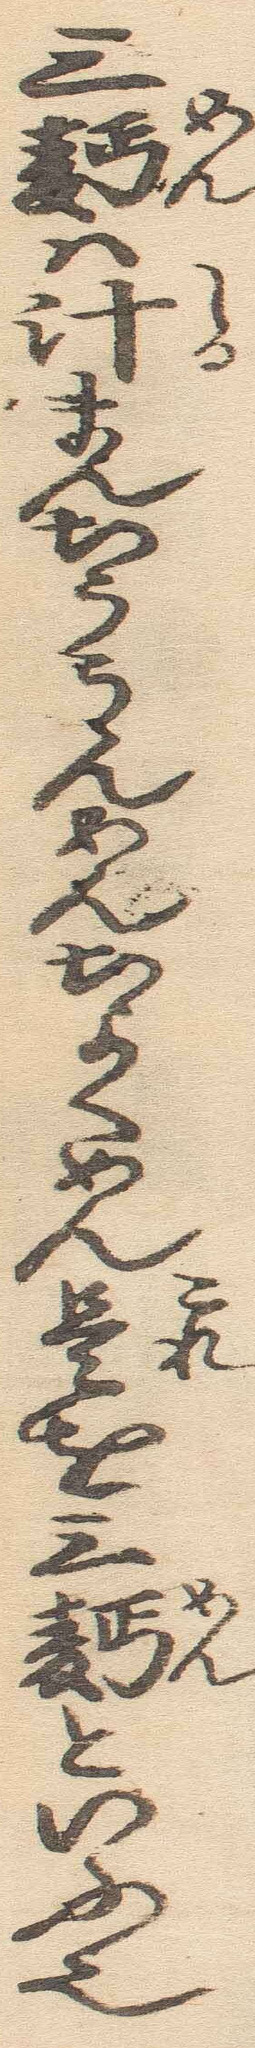三麺は汁まんちううんめんちよくめん是を三麺といふ也

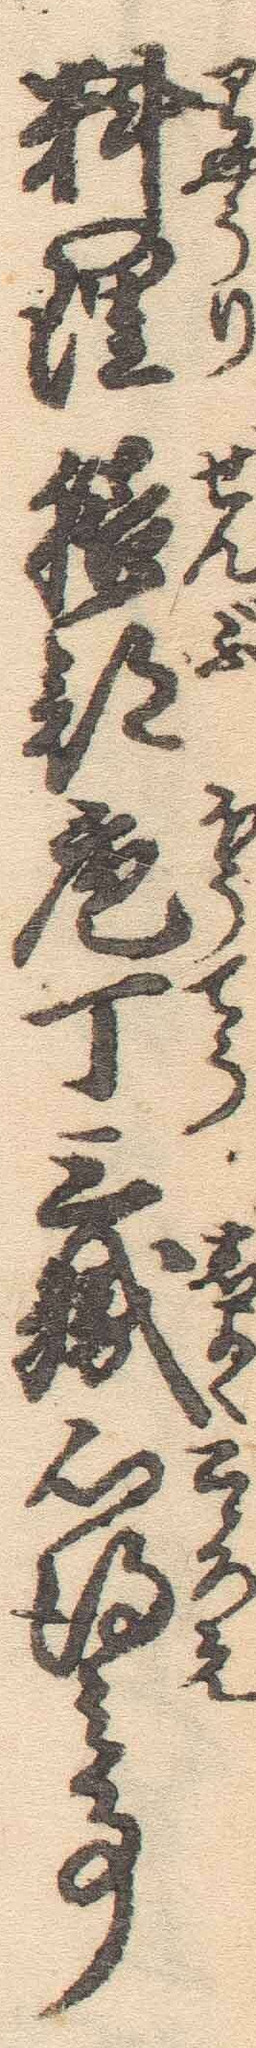料理膳部庖丁三職心得之事
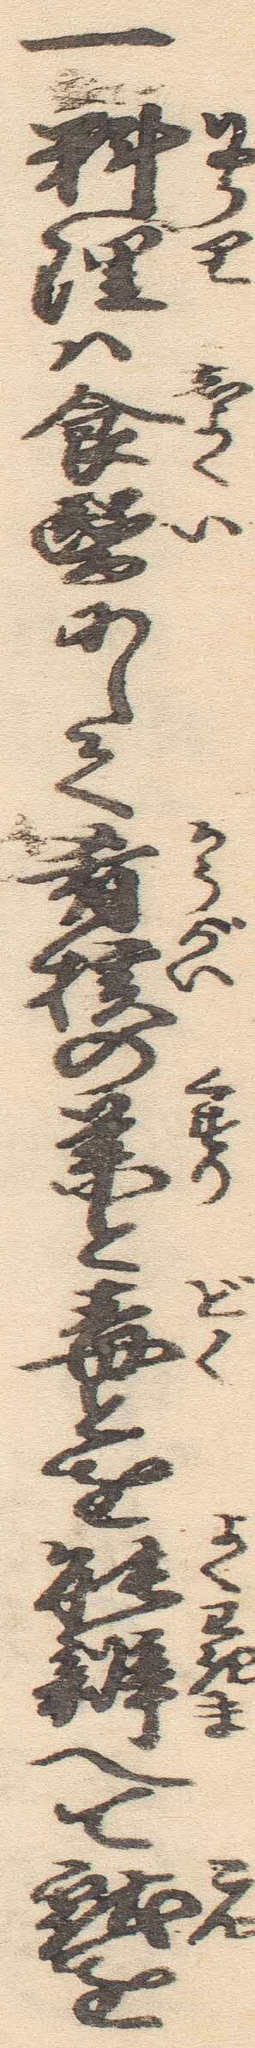一料理は食医にして肴核の薬と毒とを能弁へて献を
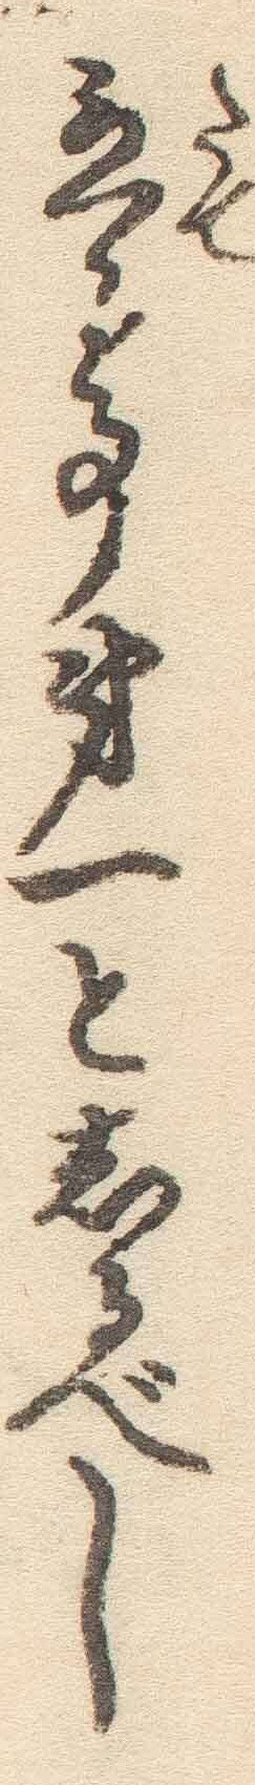立る事第一としるべし
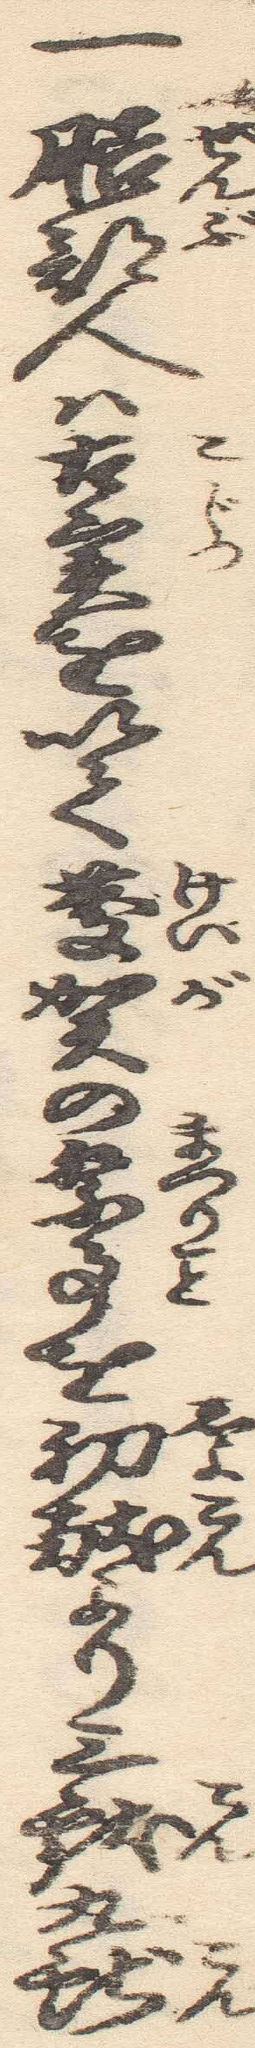一膳部人は古実を以て慶賀の祭事を初献より三献九献
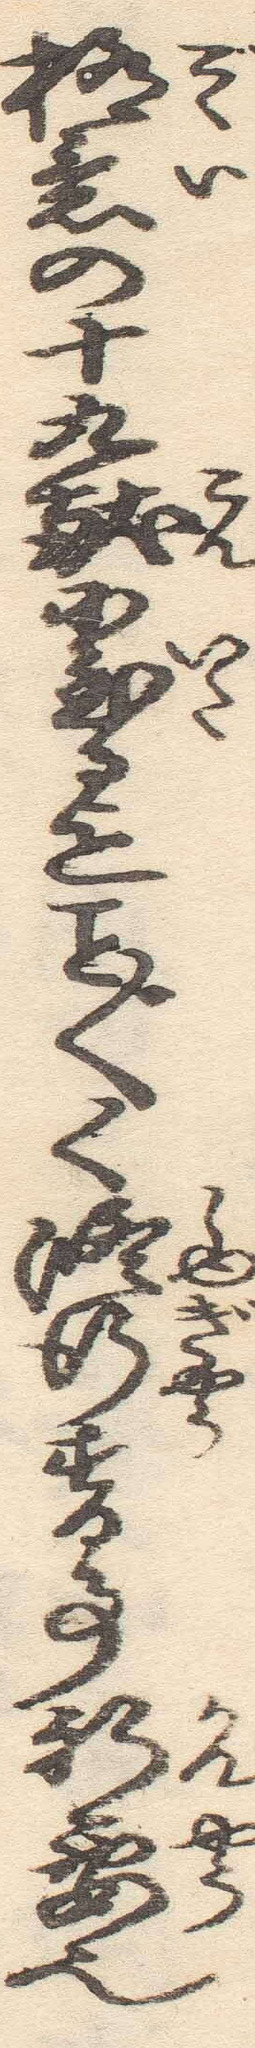極意の十九献に至る迄こと〴〵く修行する事肝要也
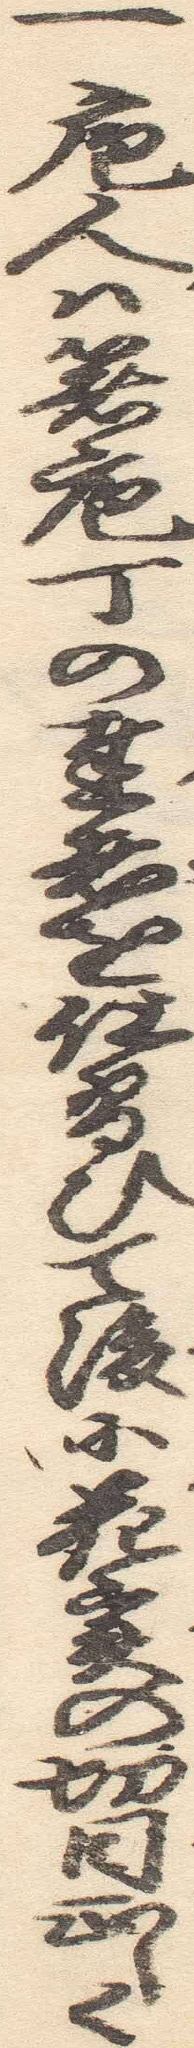一庖人は箸庖丁の達者を仕習ひて後に花実の切目正しく
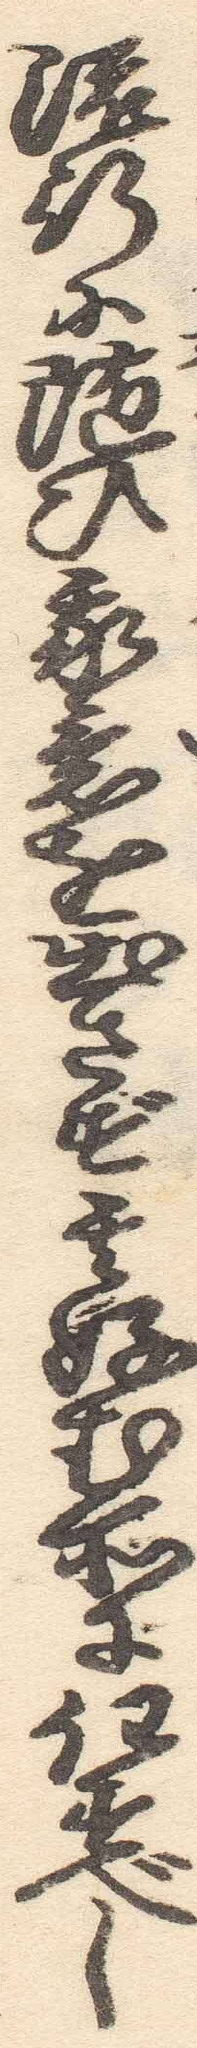流行に随ひ我意を出さず其好む所に任すべし
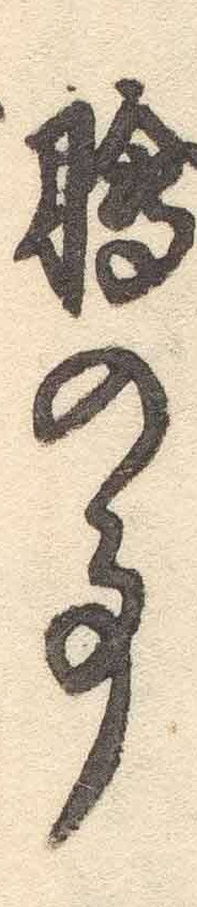鱠の事
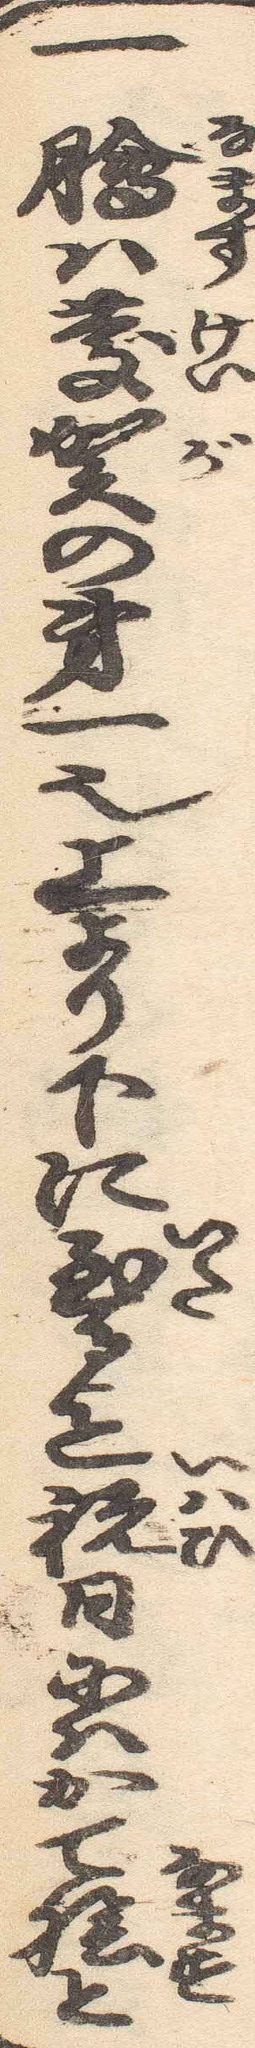一鱠は慶賀の第一也上より下に至る迄祝日にはかて鱠と
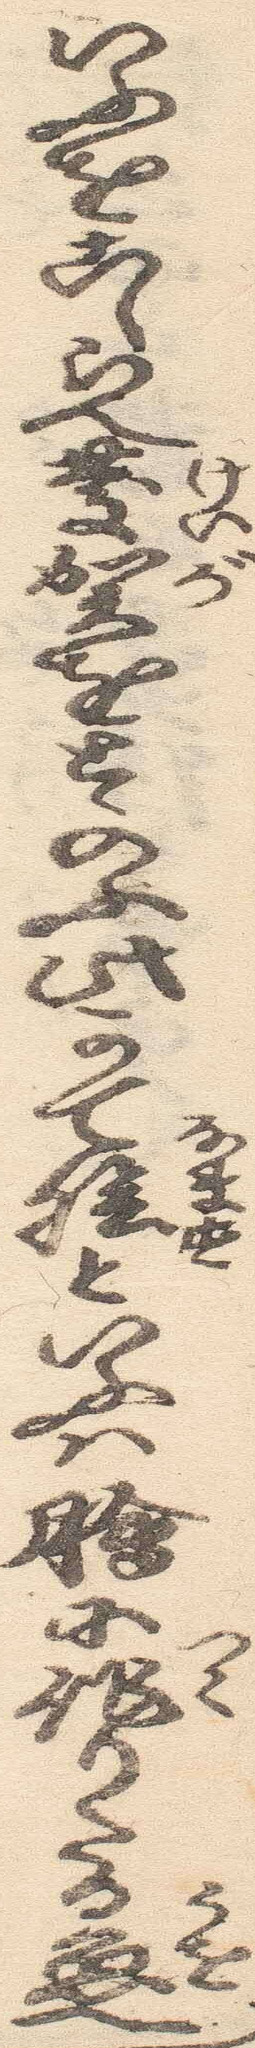いふをあしらへ慶賀をとゝのふ此かて鱠といふは鱠に作りたる魚へ
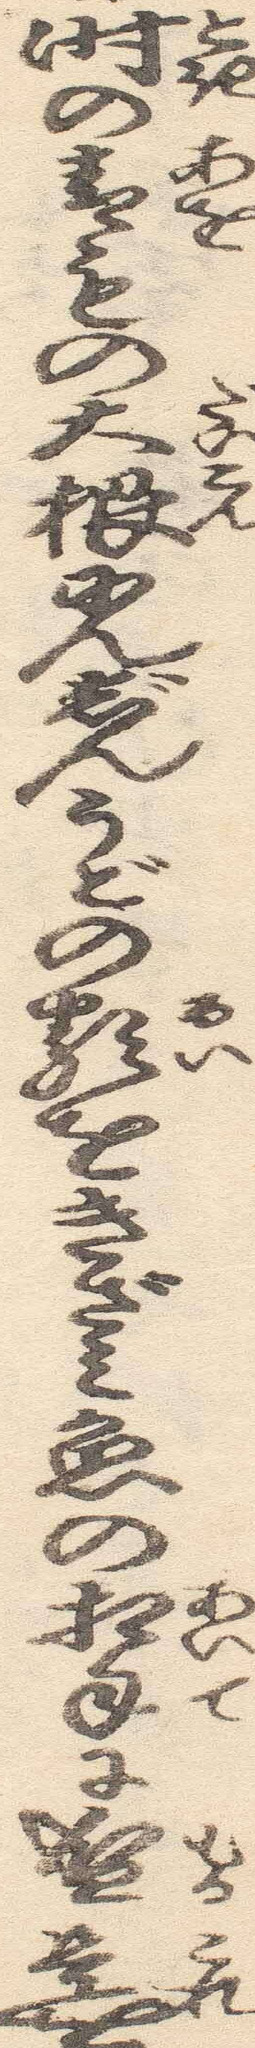時の青もの大根にんじんうどの類をきざみ魚の相手に盛是を
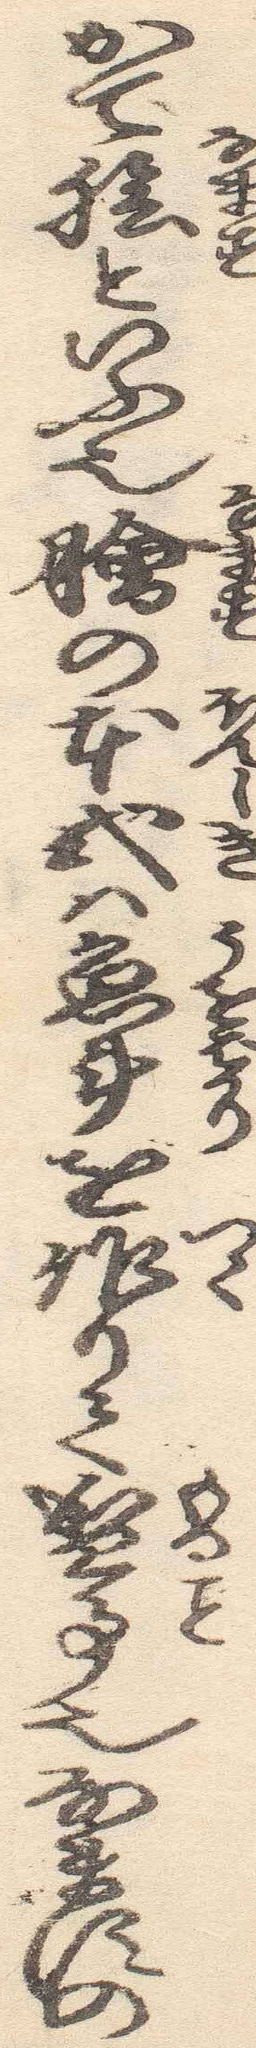かて鱠といふ也鱠の本式は魚計を作りて盛事也なますの
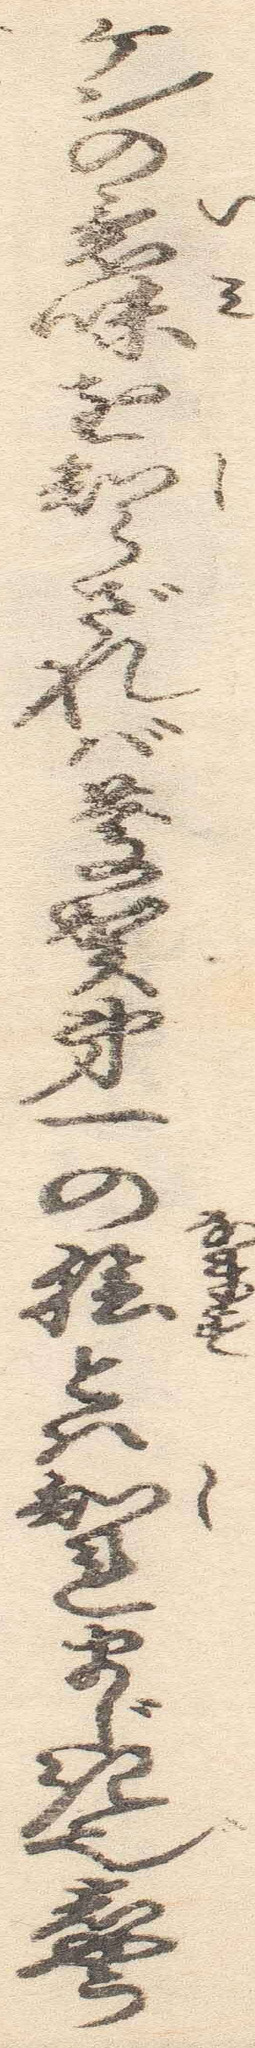ケンの意味を知らざれば慶賀第一の鱠とは知れまじき也しやう
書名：料理通
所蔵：東京学芸大学附属図書館 国文学研究資料館
